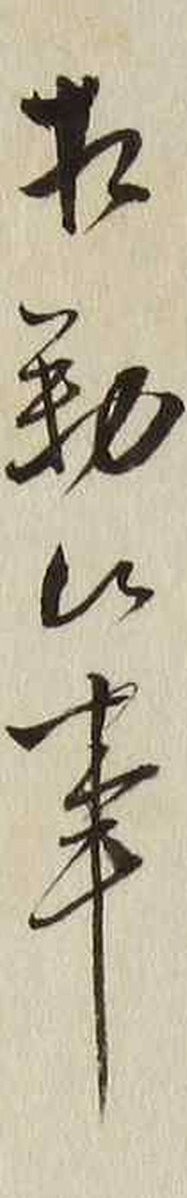相勤候事
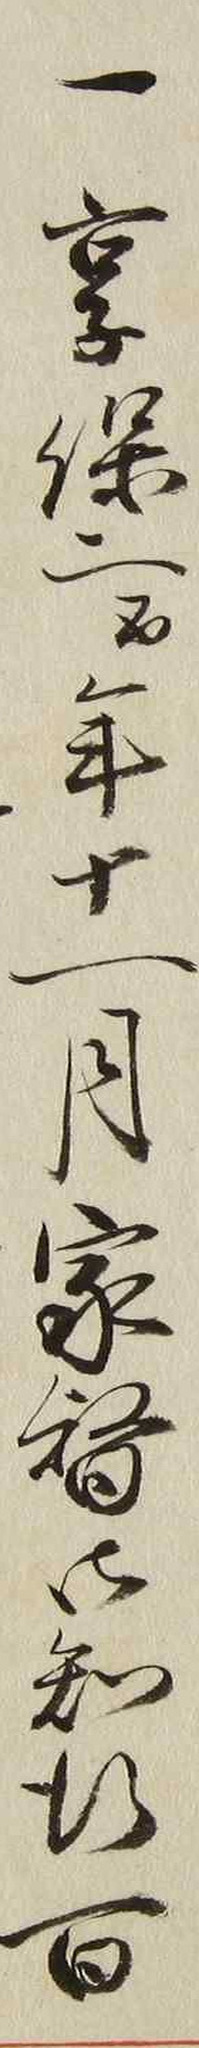一享保二酉年十一月家督御知行百
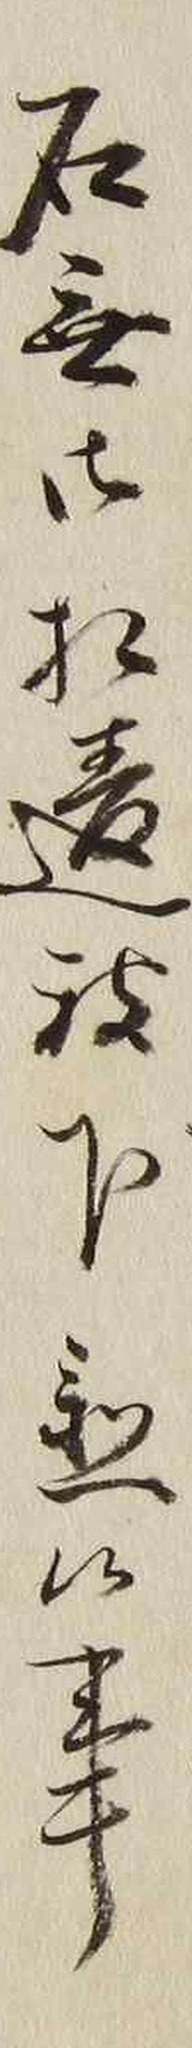石無御相違被下置候事
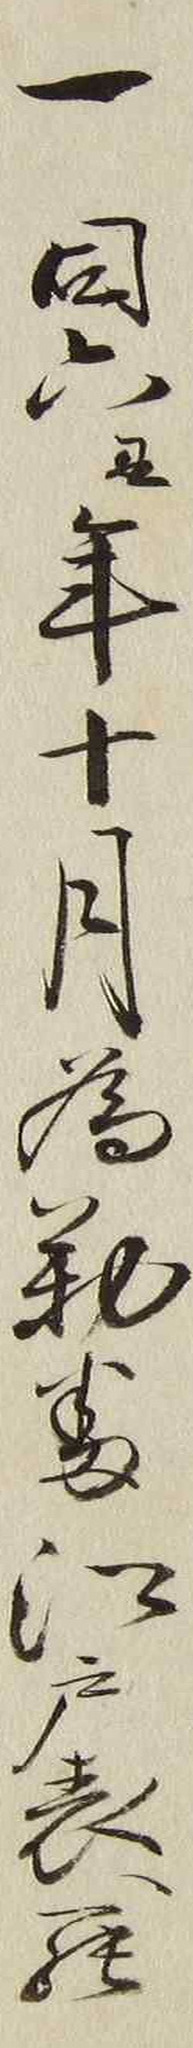一同六丑年十月為勤番江戸表へ罷
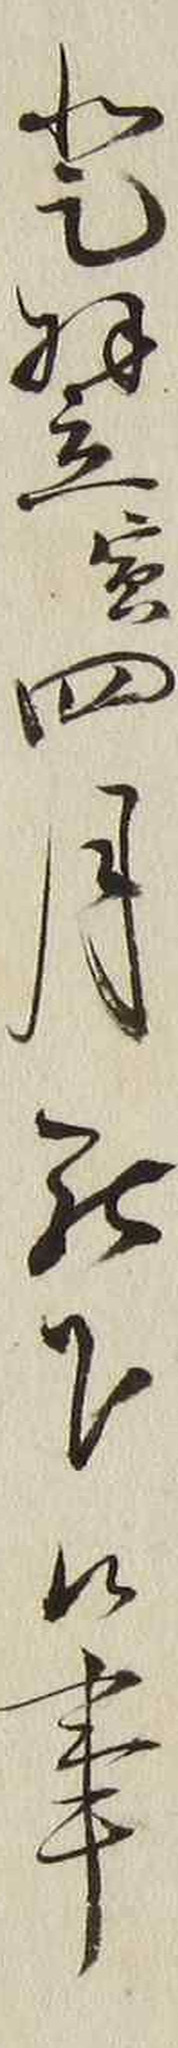登翌寅四月罷下候事
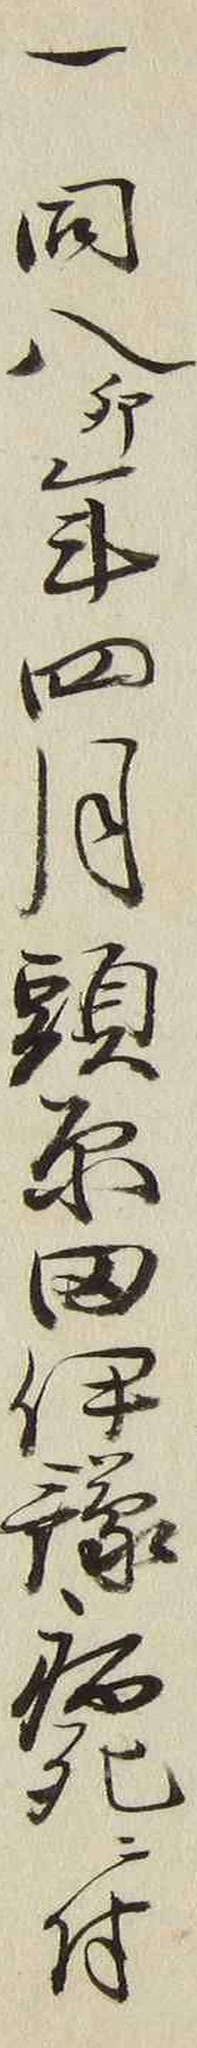一同八卯年四月頭原田伊予病死に付
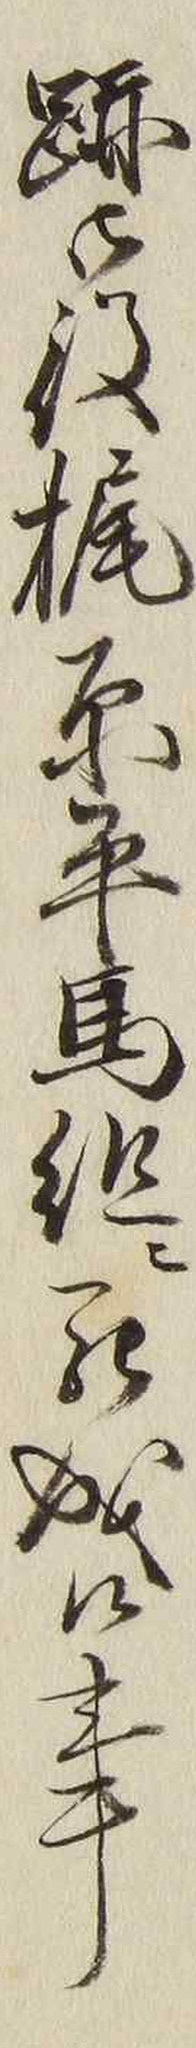跡御役梶原平馬組に罷成候事

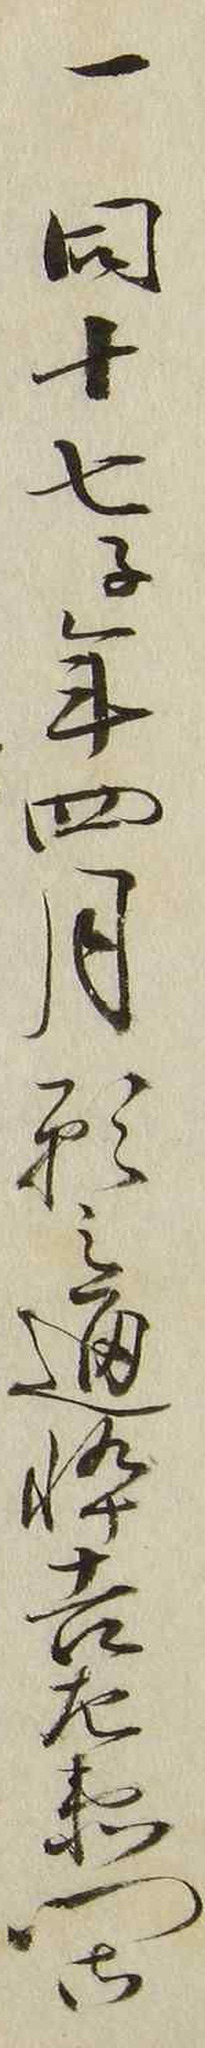一同十七子年四月願之通悴吉左衛門御
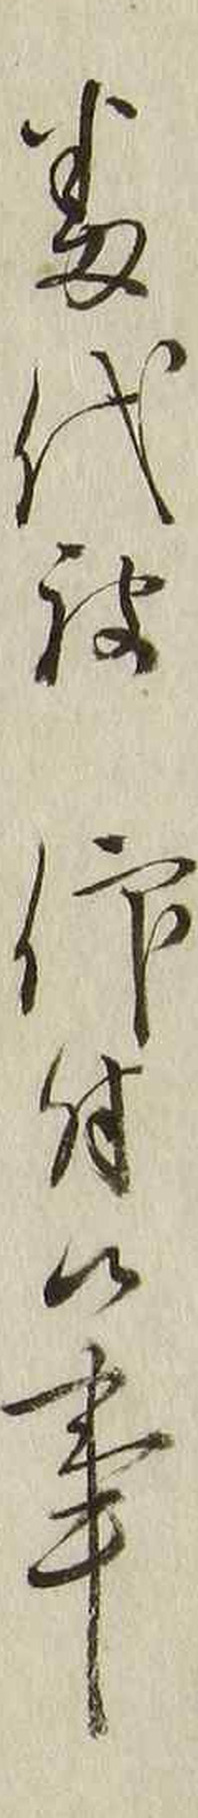番代被仰付候事
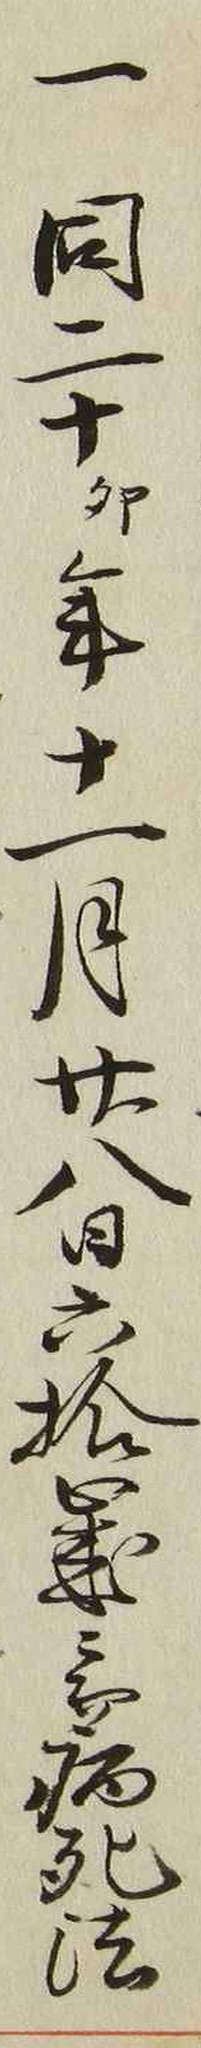一同二十卯年十一月廿八日六拾歳に而病死法
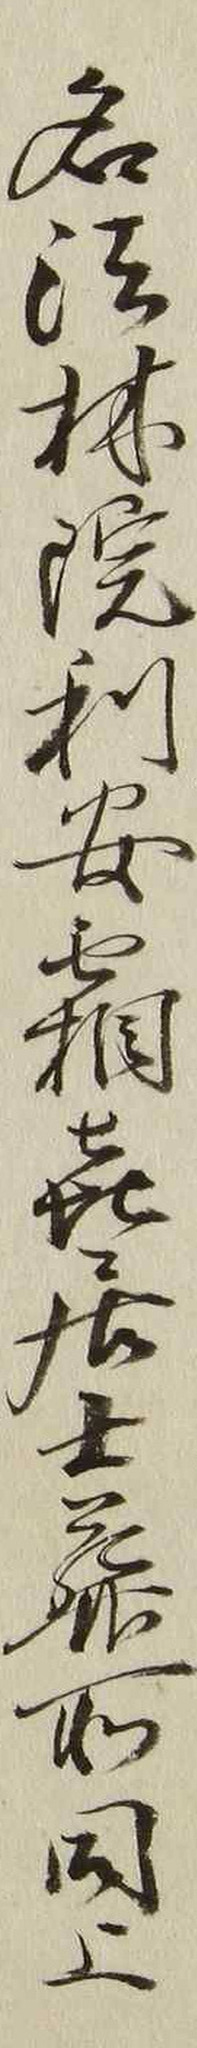名法林院利安霜喜居士葬所同上
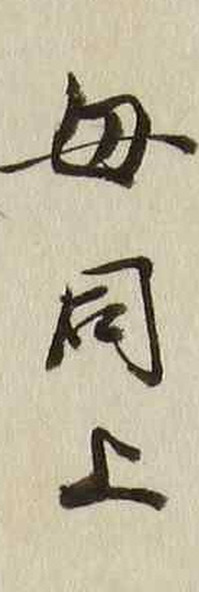母同上
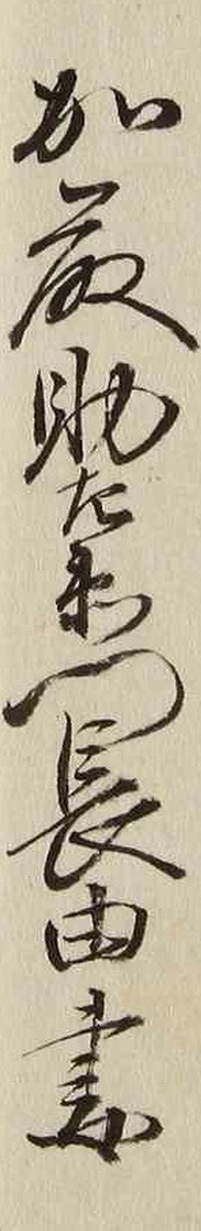女加藤助左衛門長由妻
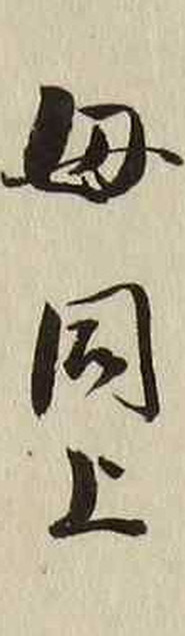母同上
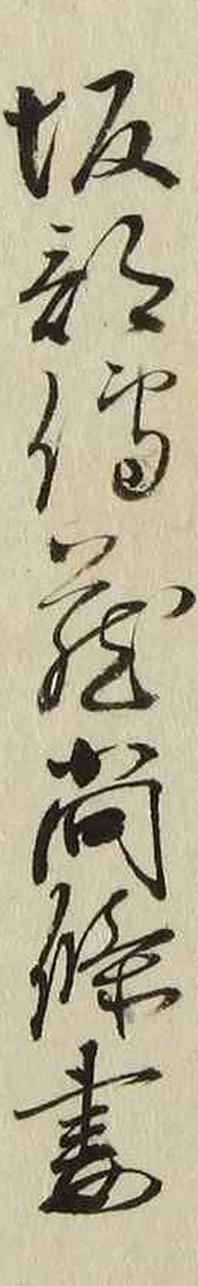女坂部伝蔵尚条妻
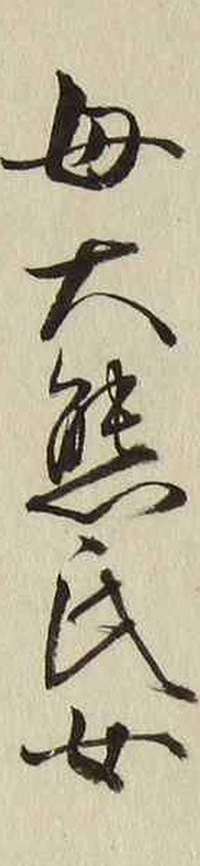母大熊氏女
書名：諸士系譜　巻之157　ね之部1
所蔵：会津若松市立会津図書館
